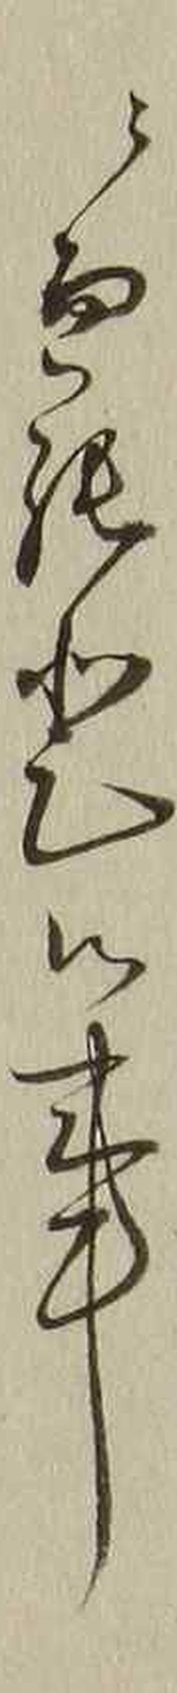に而罷登候事
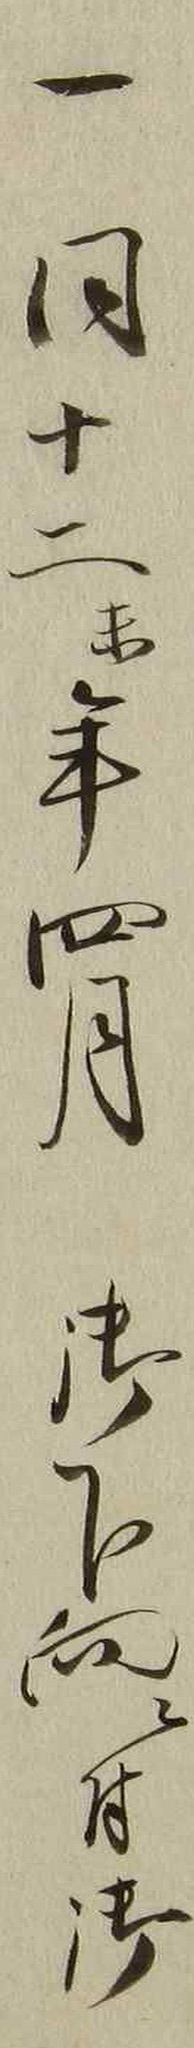一同十二末年四月御下向に付御
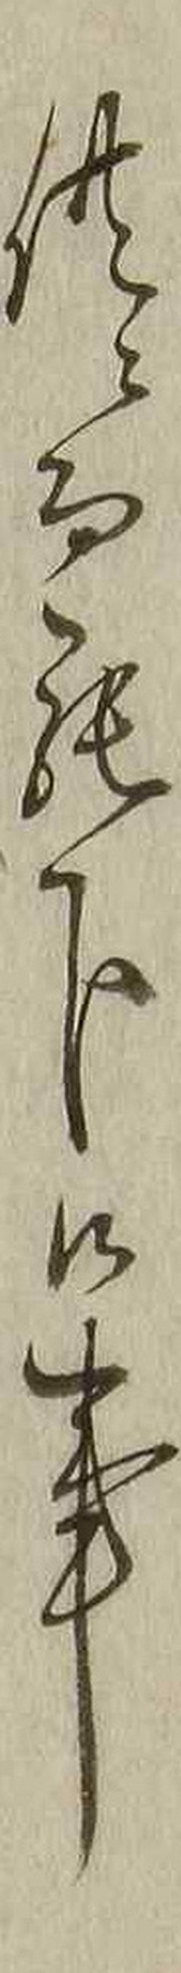供に而罷下候事
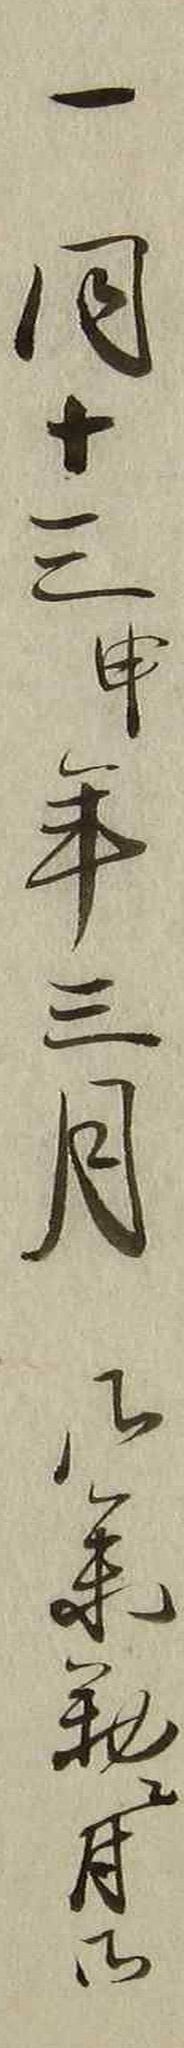一同十三申年三月御参勤に付御
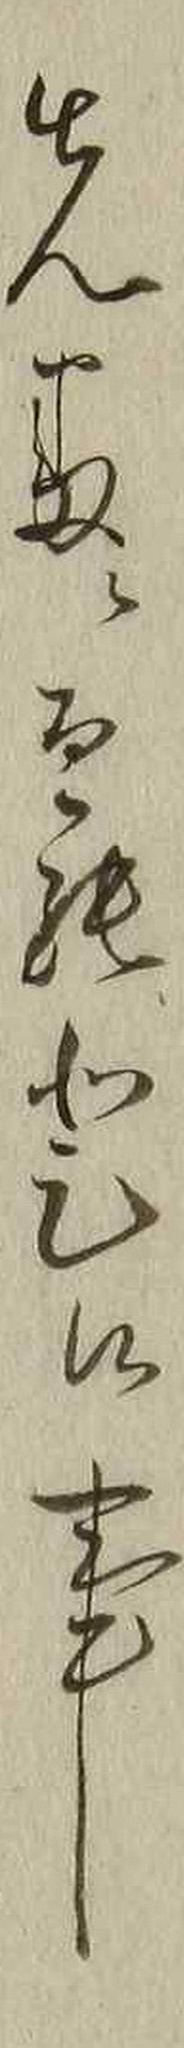先番に而罷登候事
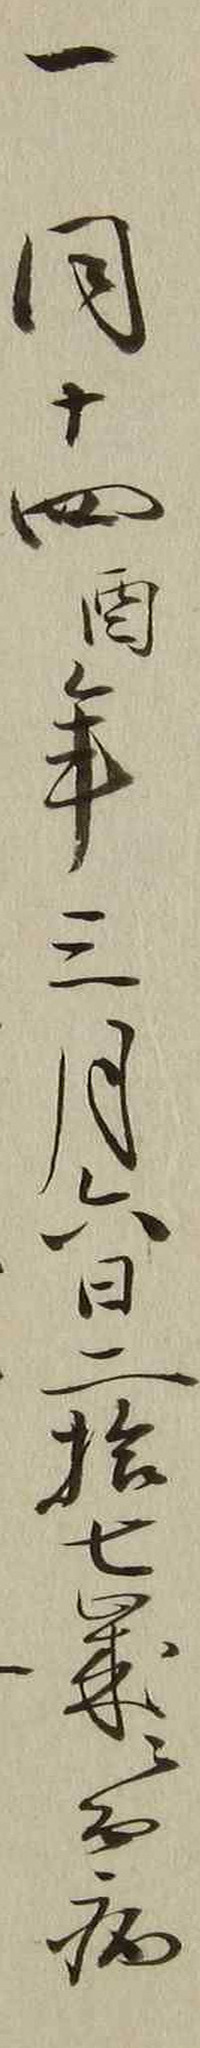一同十四酉年三月六日二拾七歳に而病
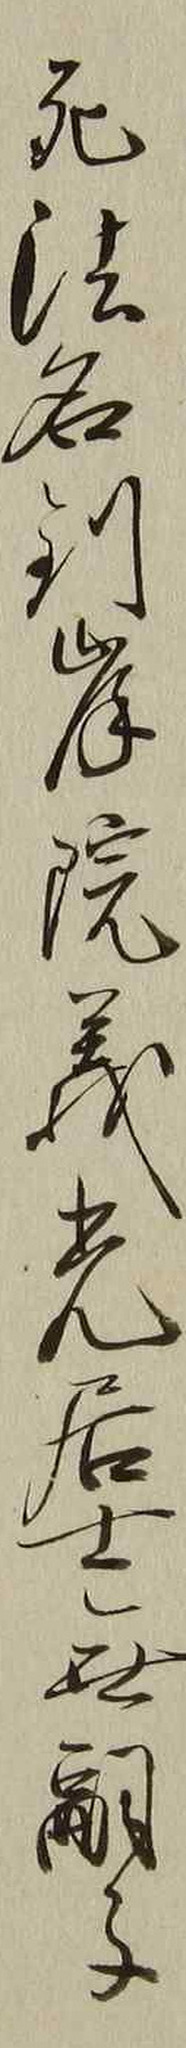死法名到岸院義光居士無嗣子
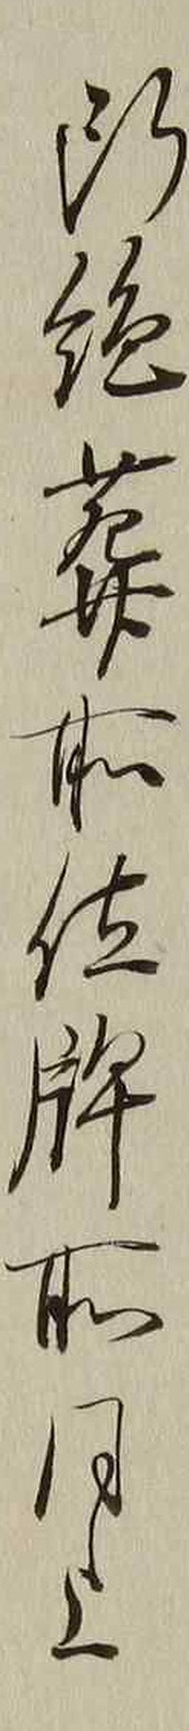断絶葬所位脾所同上
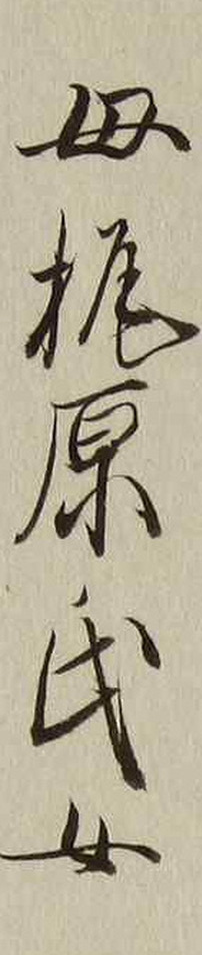母梶原氏女
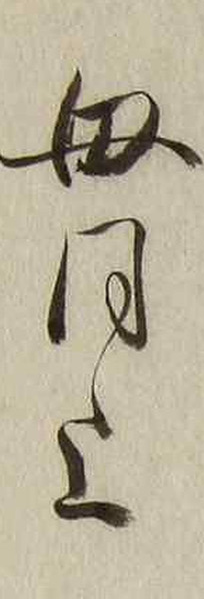母同上
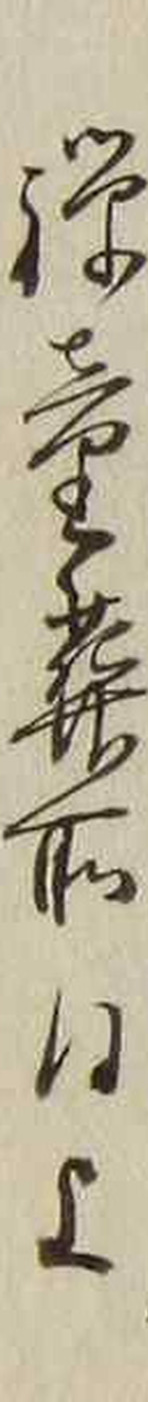禅童葬所同上

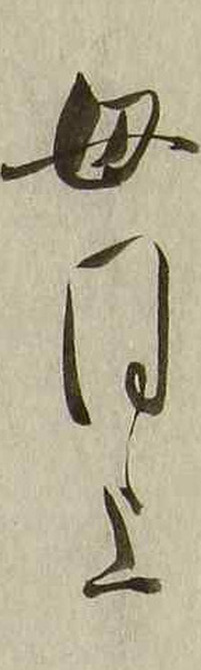母同上
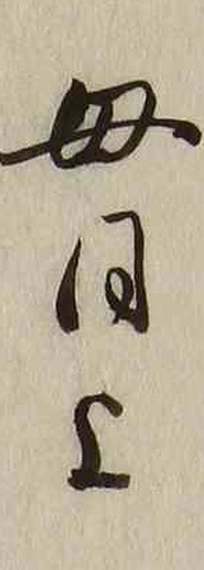母同上
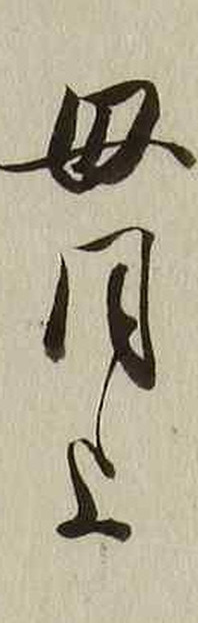母同上
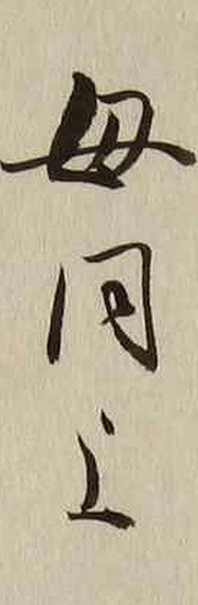母同上
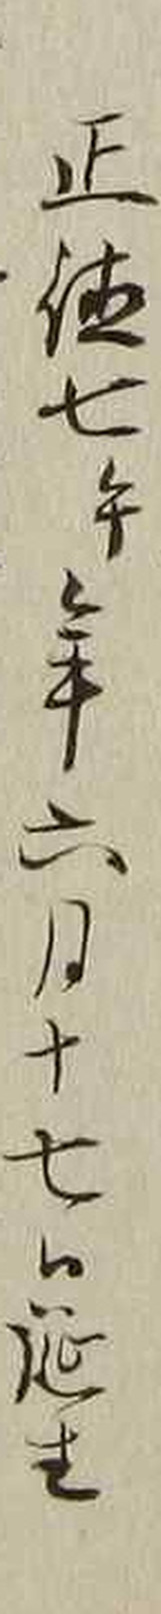正徳七午年六月十七日誕生
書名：諸士系譜　巻之103　か之部11
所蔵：会津若松市立会津図書館
